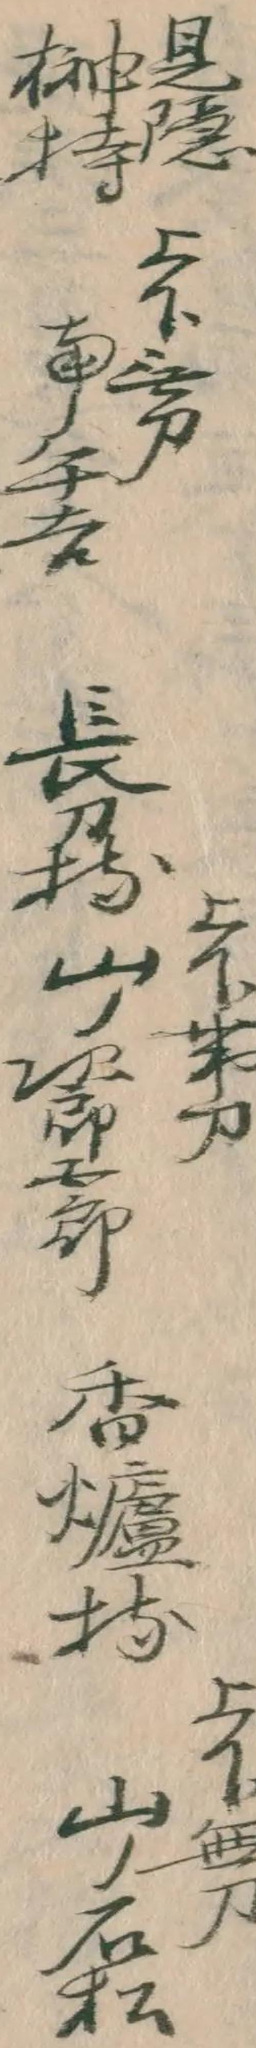榊持南ノ午吉長刀持山ノ次郎五郎香爐持山ノ石松
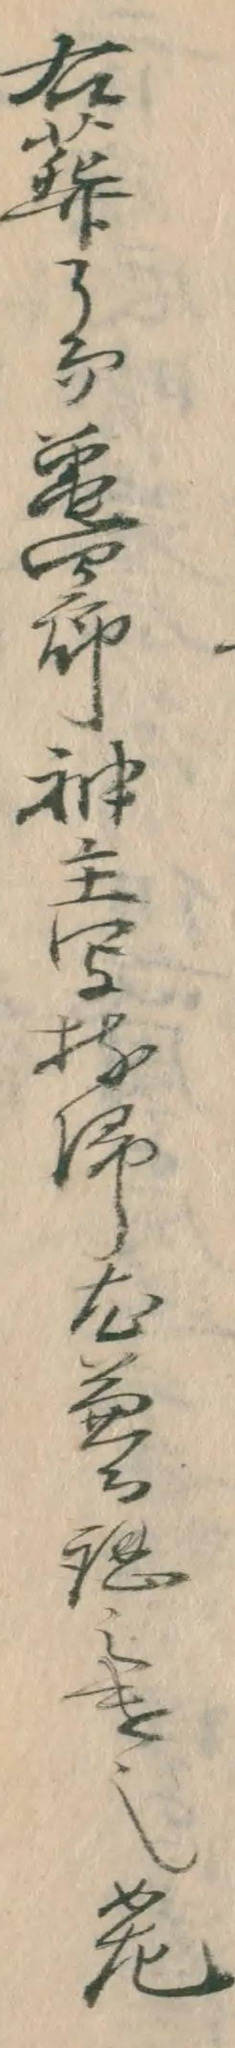右葬了而亀四郎神王写持帰尤兼而認之遣之如左

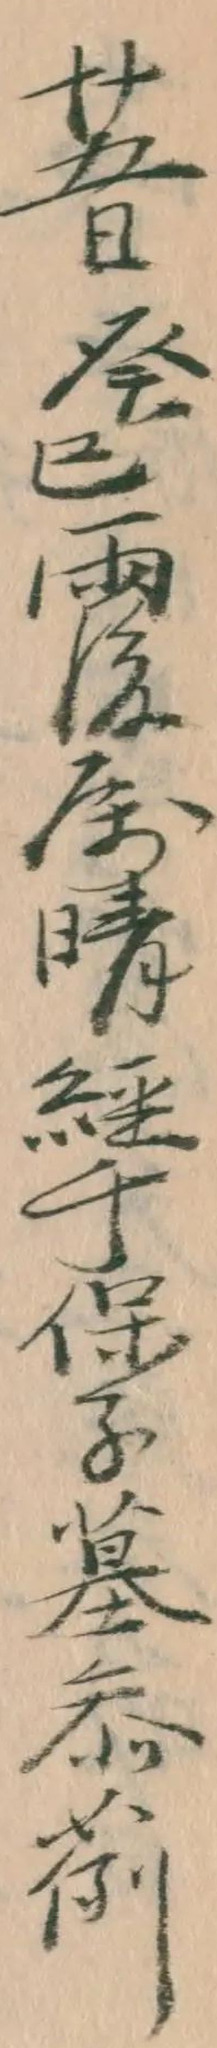廿五日癸巳雨後属晴経千保子墓参如例
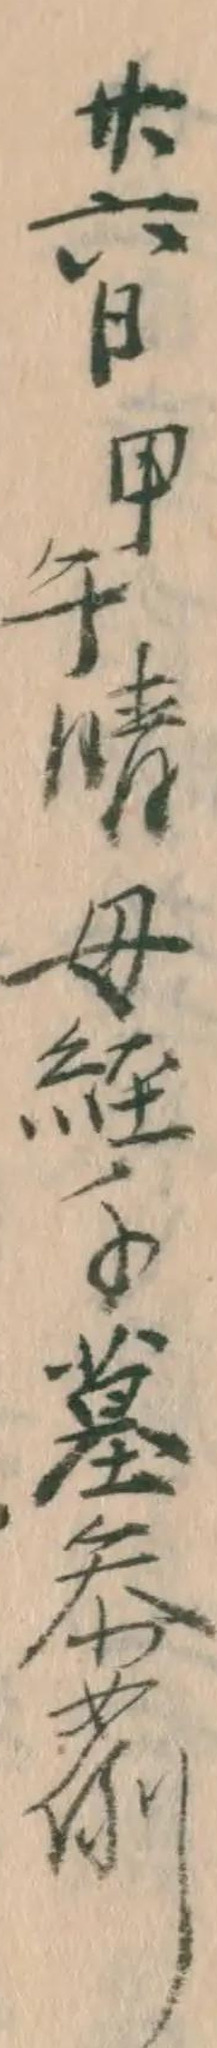廿六日甲午晴母経千墓参如例
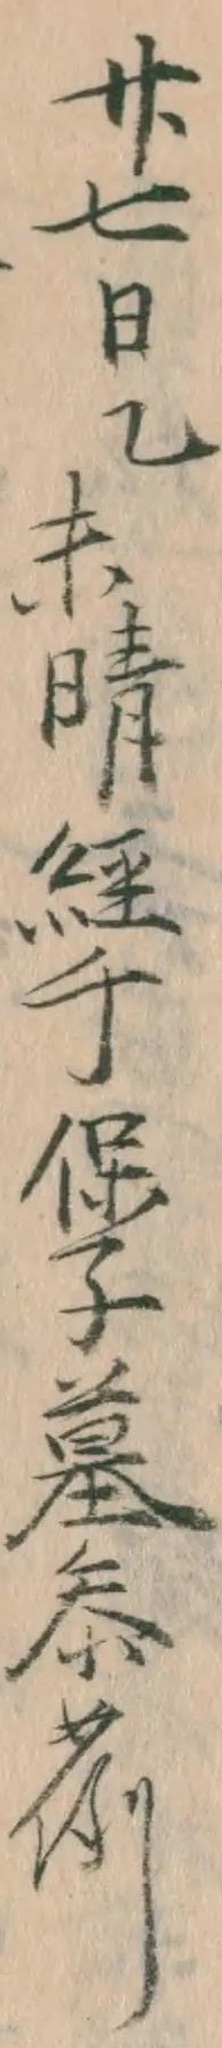廿七日乙未晴経千保子墓参如例
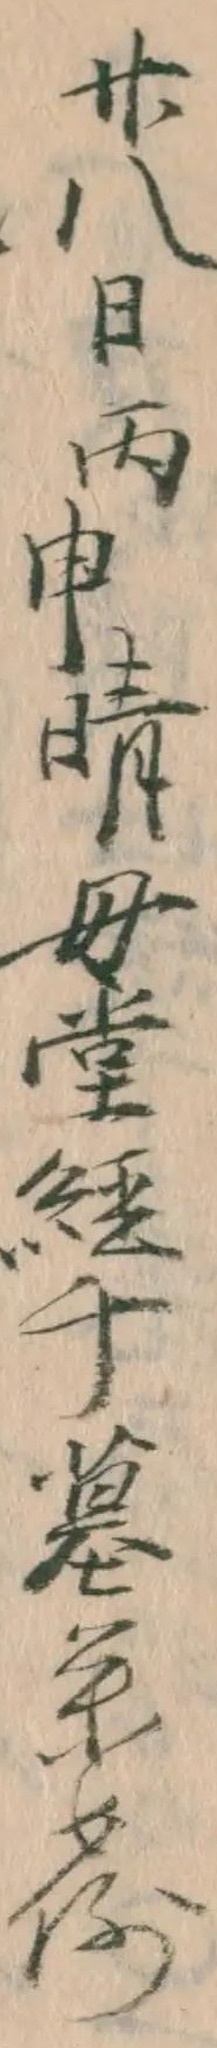廿八日丙申晴母堂経千墓参如例
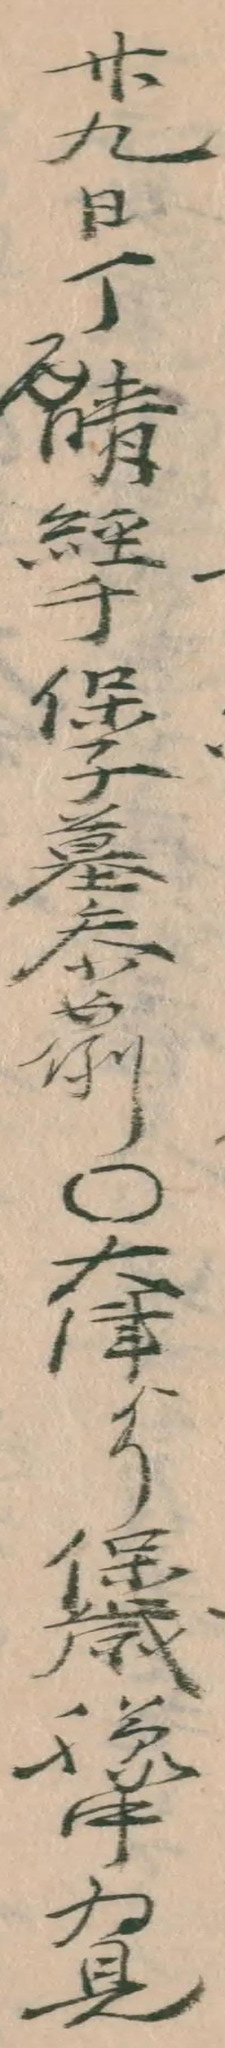廿九日丁酉晴経千保子墓参如例〇大津より保歳朦中為見
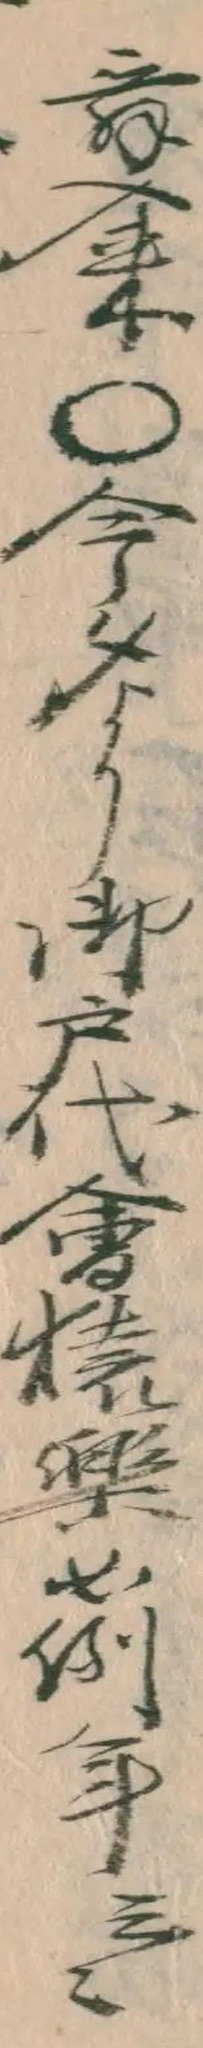舞入来○今夕より御戸代會猿楽如例年云々
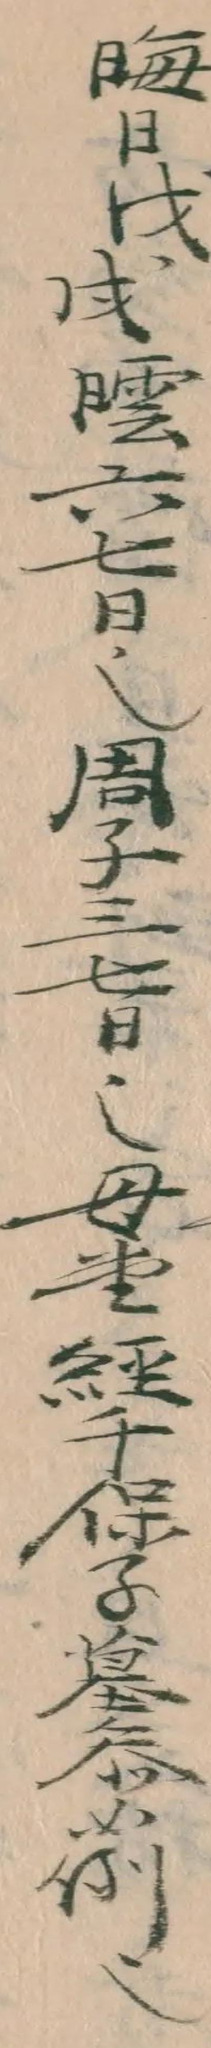晦日戊戌曇六七日也周子三七日也母堂経千保子墓参如例也
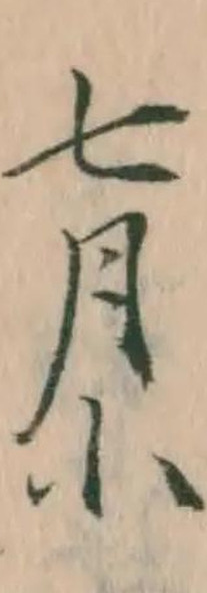七月小
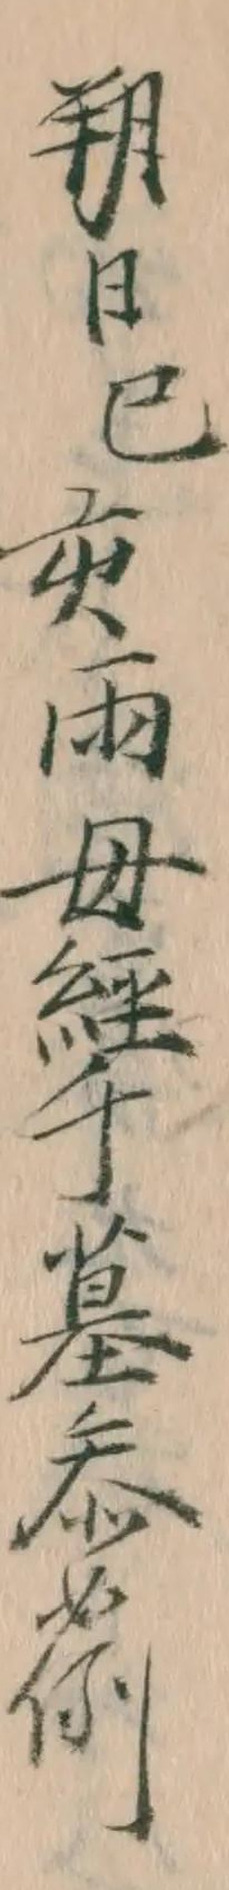朔日己亥雨母経千墓参如例
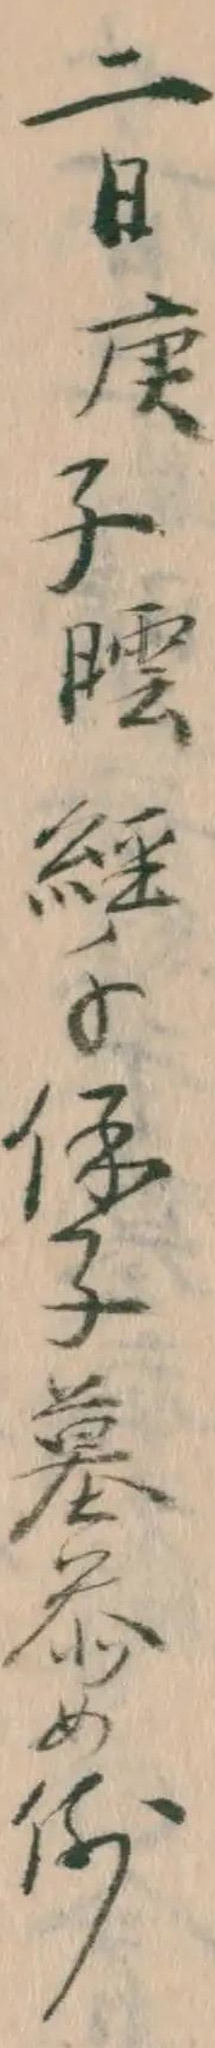二日庚子曇経千保子墓参如例
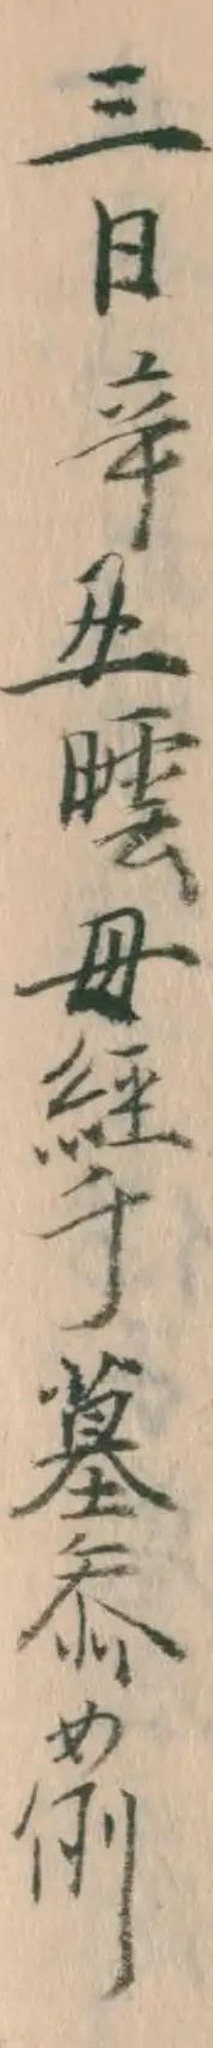三日辛丑曇母経千墓参如例
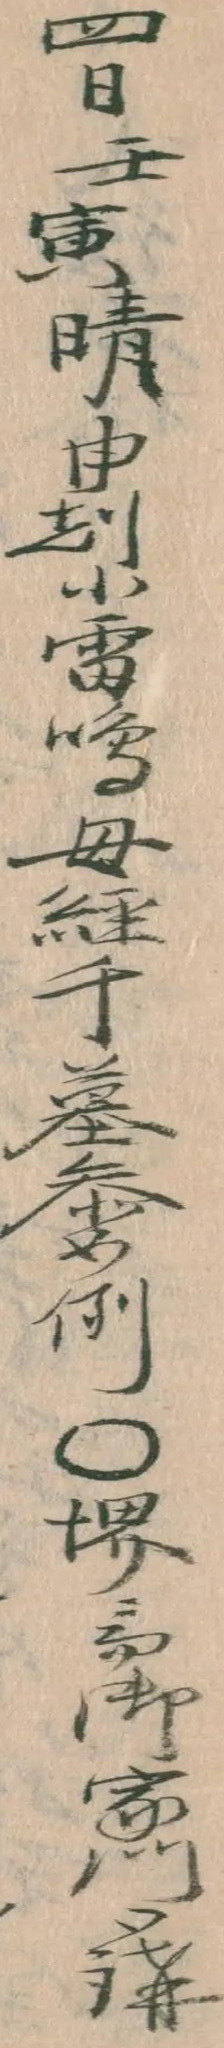四日壬寅晴申刻小雷鳴母経千墓参如例〇堺ニ而御家門御講
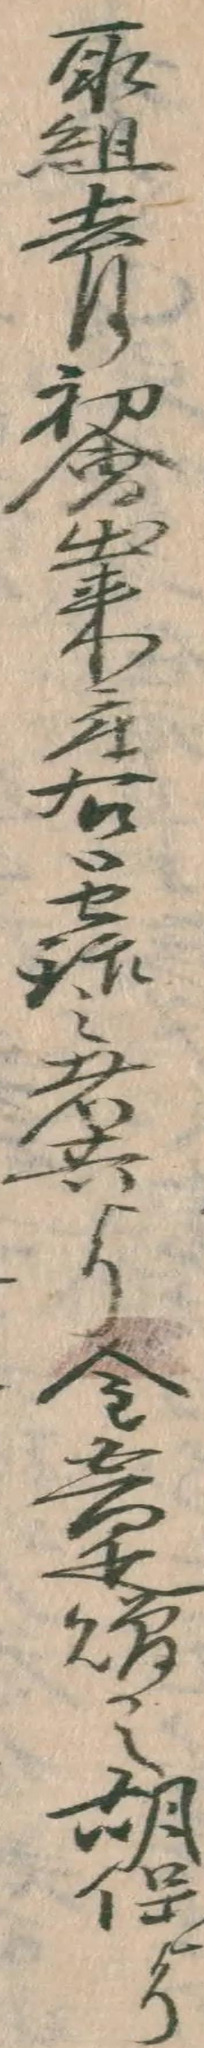取組去月初會出来ニ付右御世話之者共より金五百疋贈也胡保より
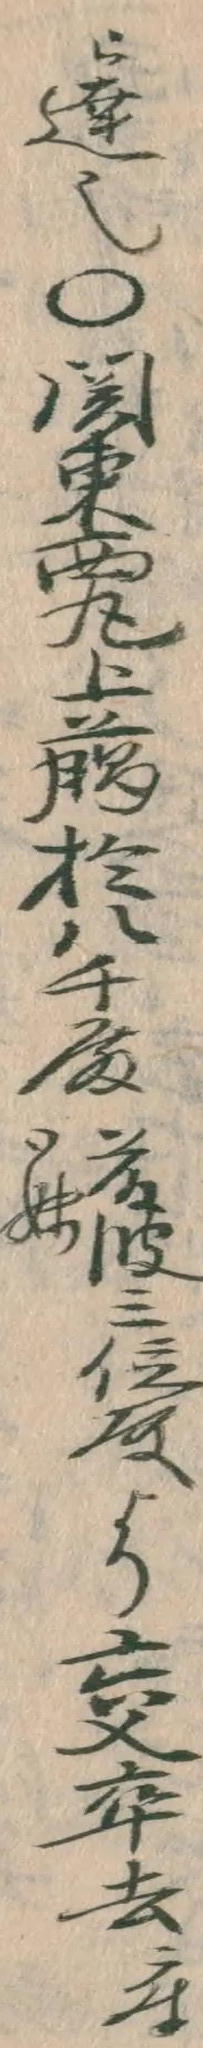被達也○関東西丸上臈於八千殿藤波三位殿より御妹亡父卒去ニ付
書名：賀茂社記録. 第65冊
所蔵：国立国会図書館 National Diet Library, JAPAN
